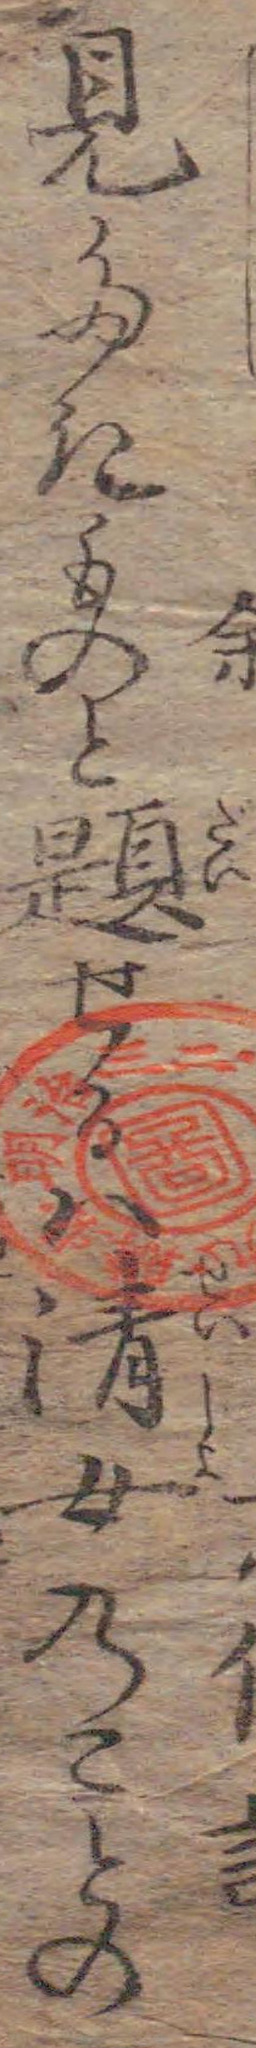見たきものと題せるは清女のことの
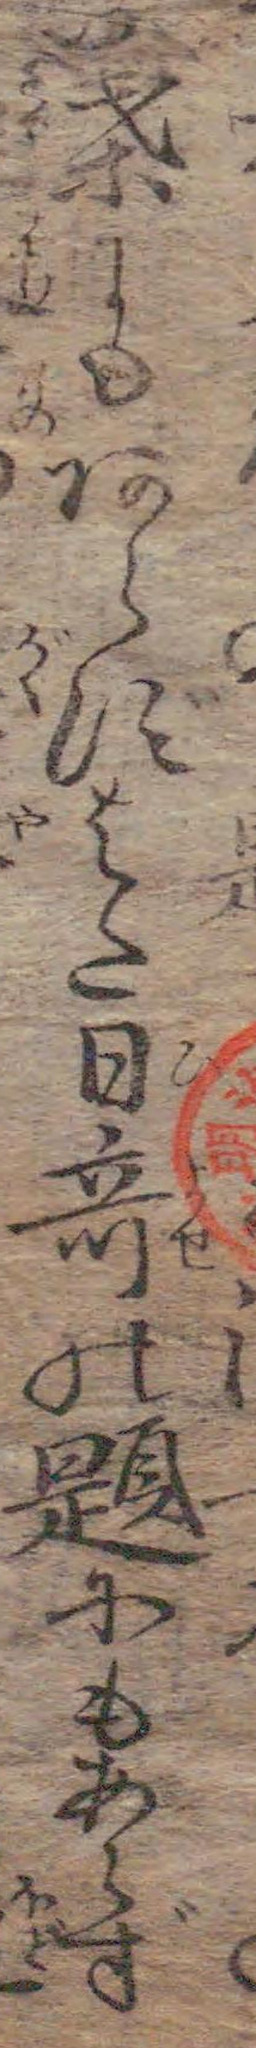葉にもあらずはた日奇の題にもあらず
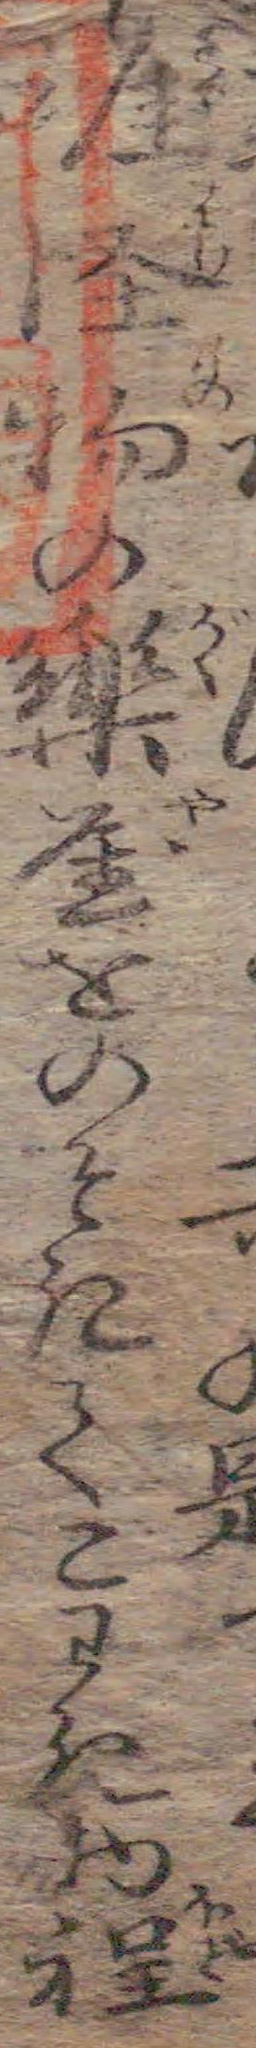唯怪物の楽屋をのそきてこわき物程
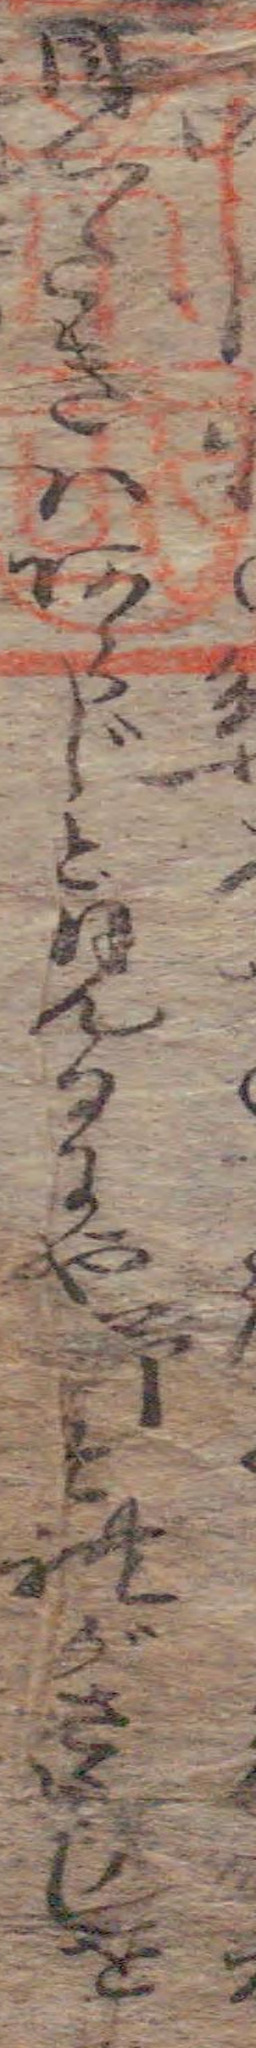見たきはあらじと見るにや予それがさうしを
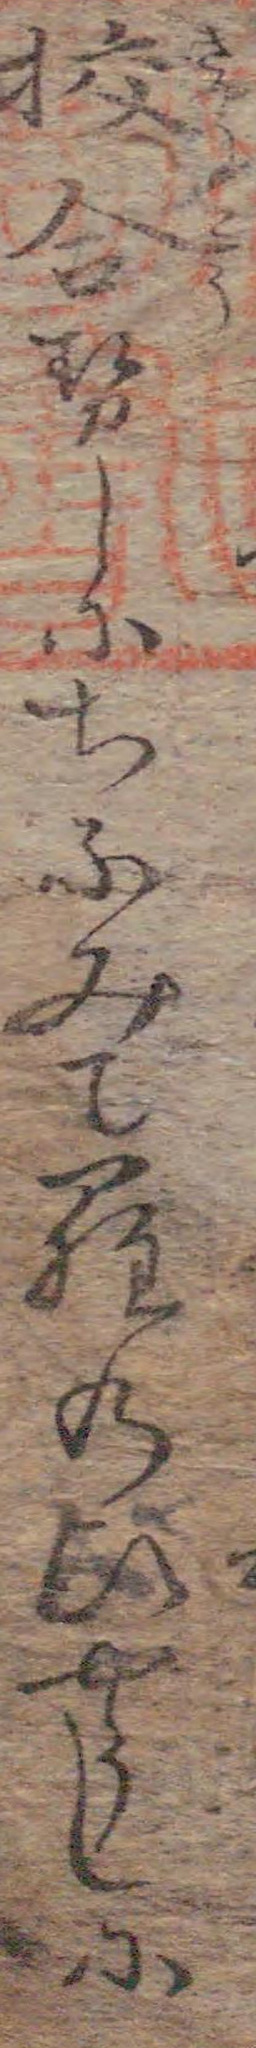校合せしにちふみこらのひやうしに
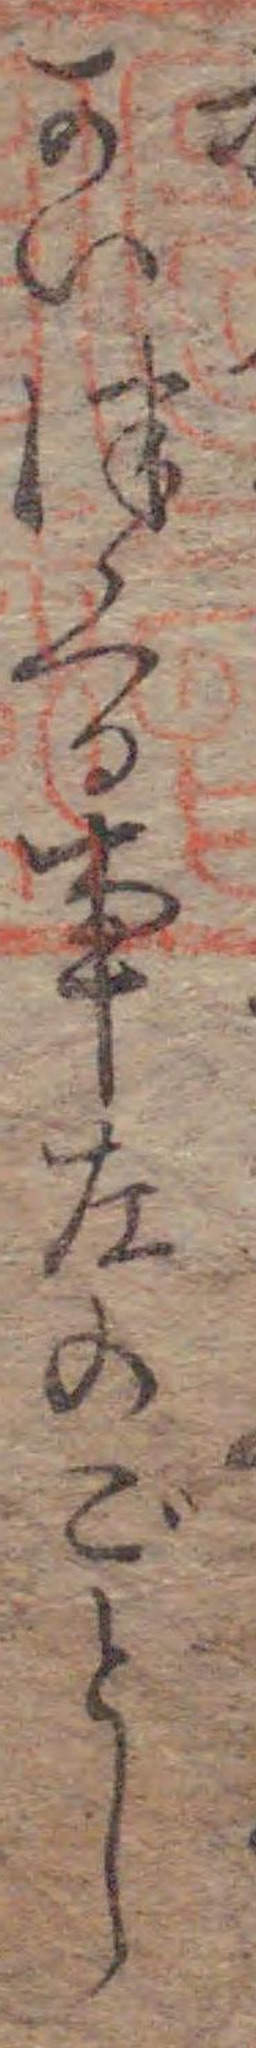かいつくる事左のごとし
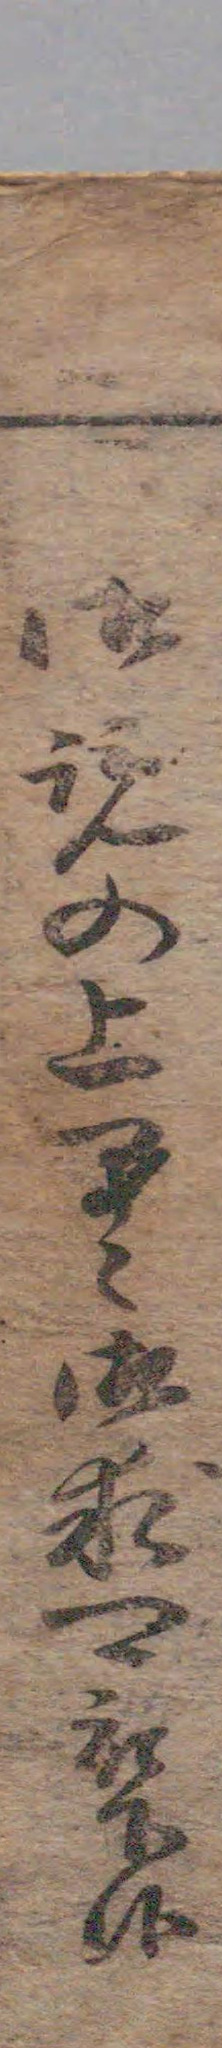御覧の上早々御求可被下候
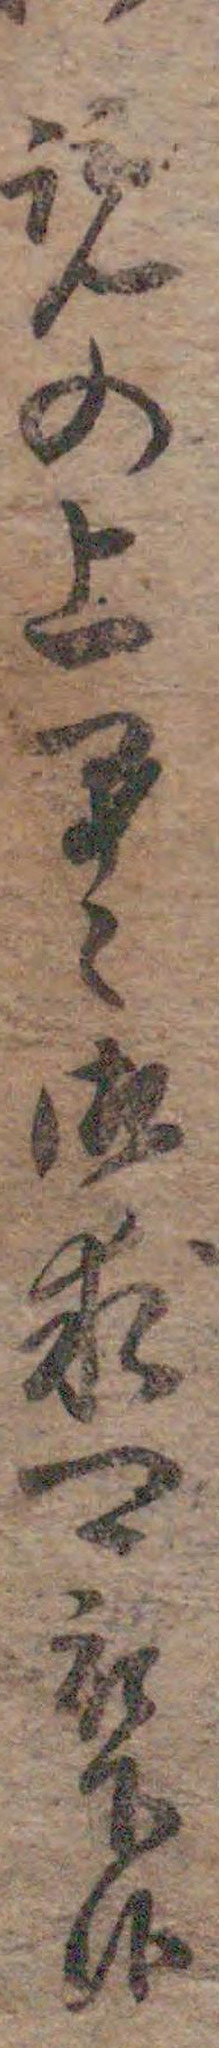御覧の上早々御求可被下候

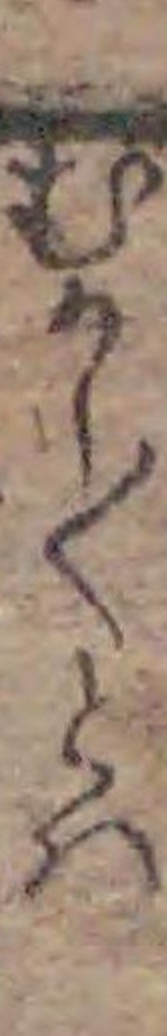むかし〳〵とは
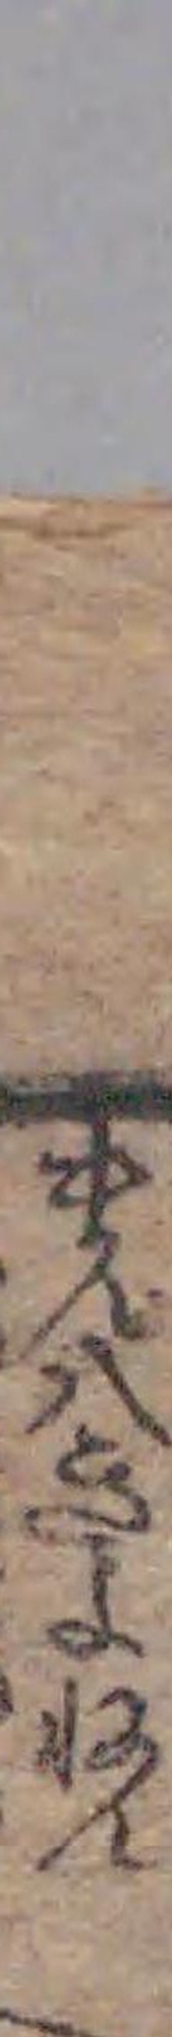まん八きよねん
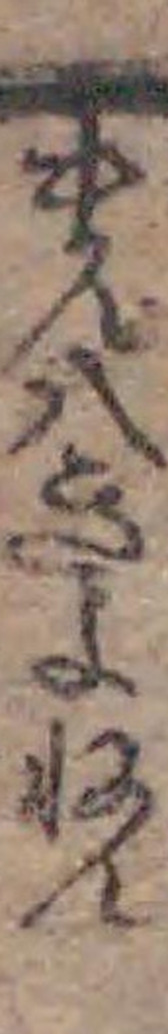まん八きよねん
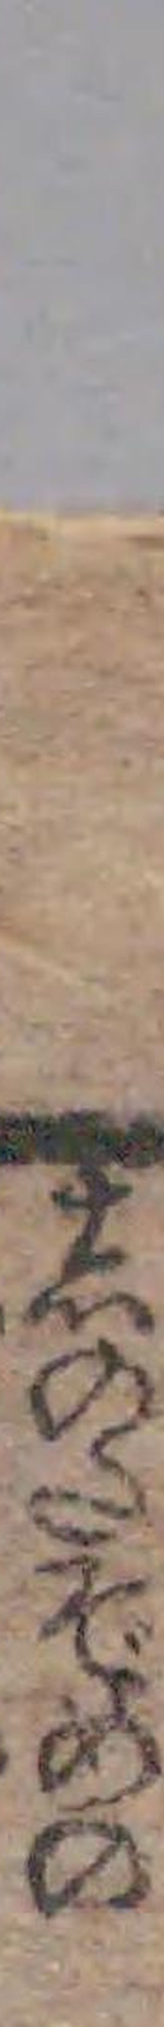しのたぞめの
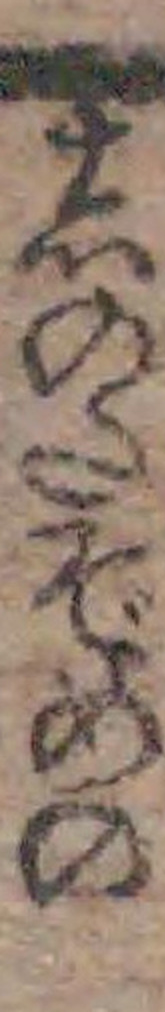しのたぞめの
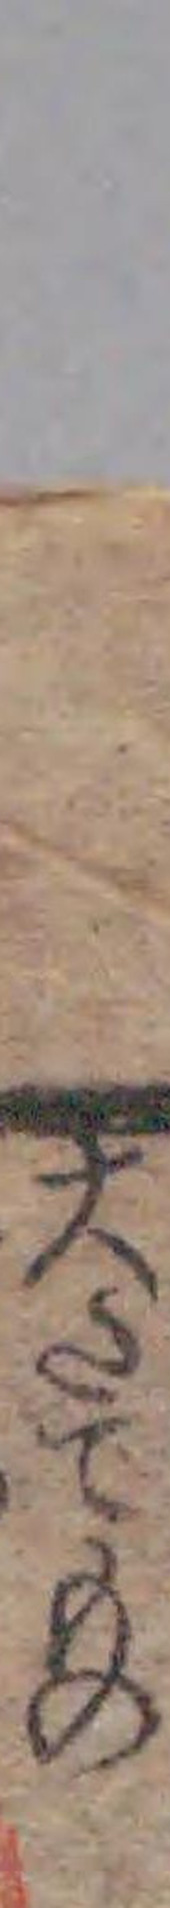大たてもの
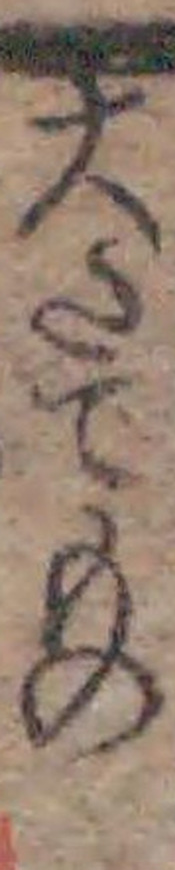大たてもの
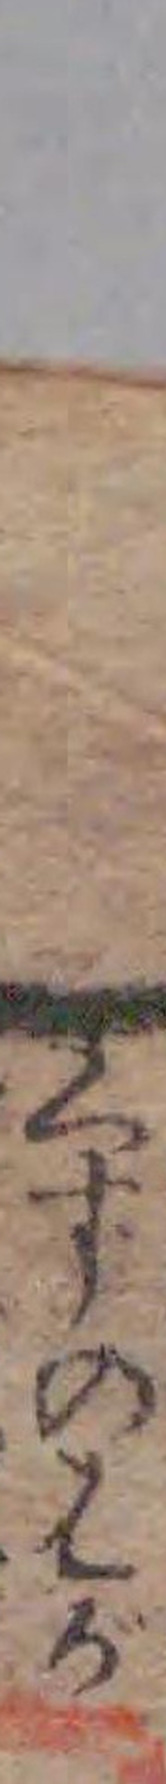くすのはが
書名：化物楽屋異牒 : 2巻
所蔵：国立国会図書館 National Diet Library, JAPAN
